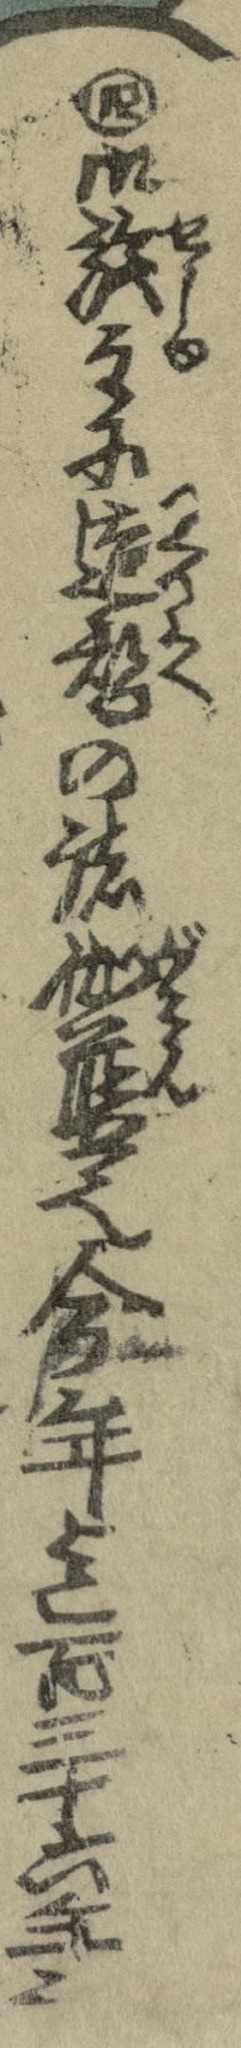㊃御施主に造替の諸伽藍也今年迄百三十六年也
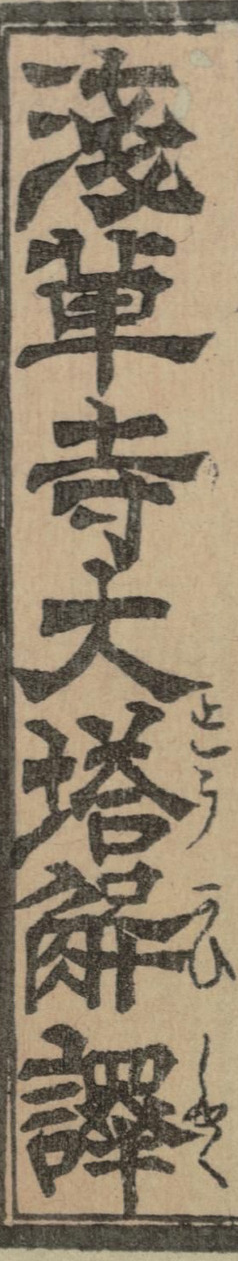浅草寺大塔解譯
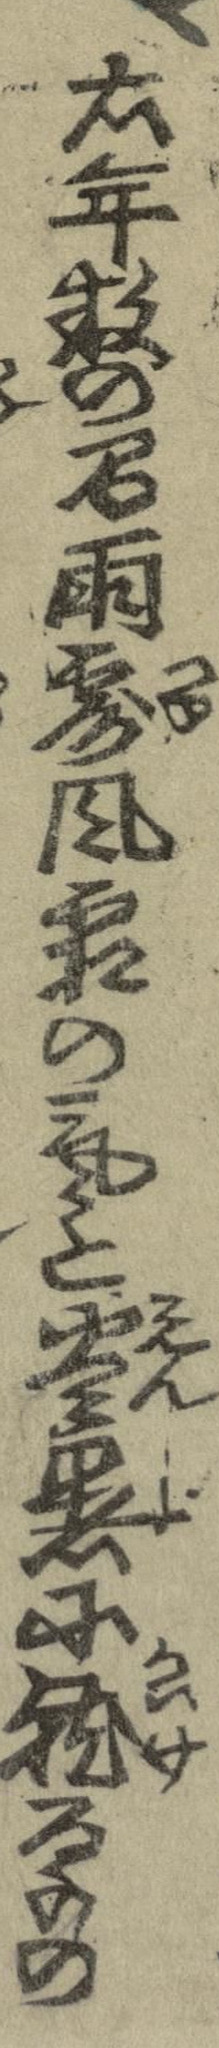右年数の間雨露風霜の気を炎暑に乾るもの
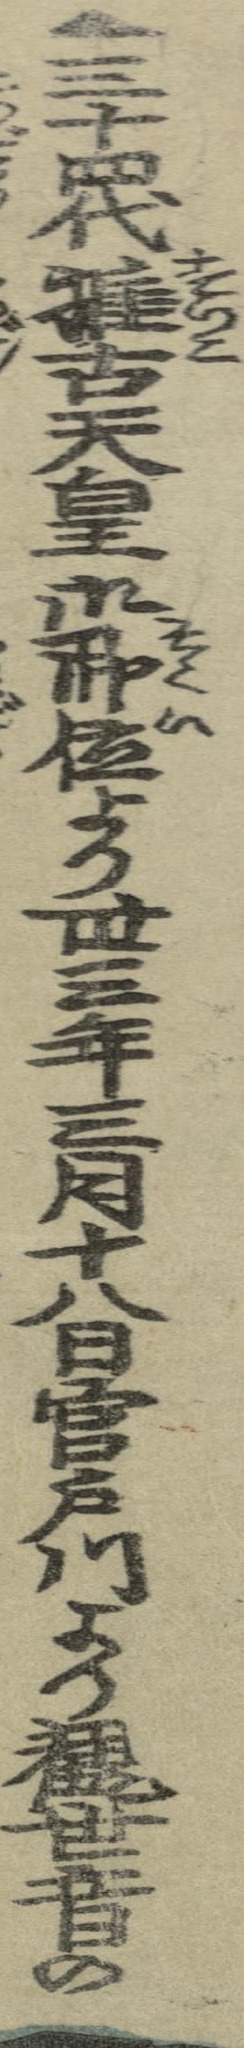▲三十四代推古天皇御即位より卅三年三月十八日宮戸川より観世音の
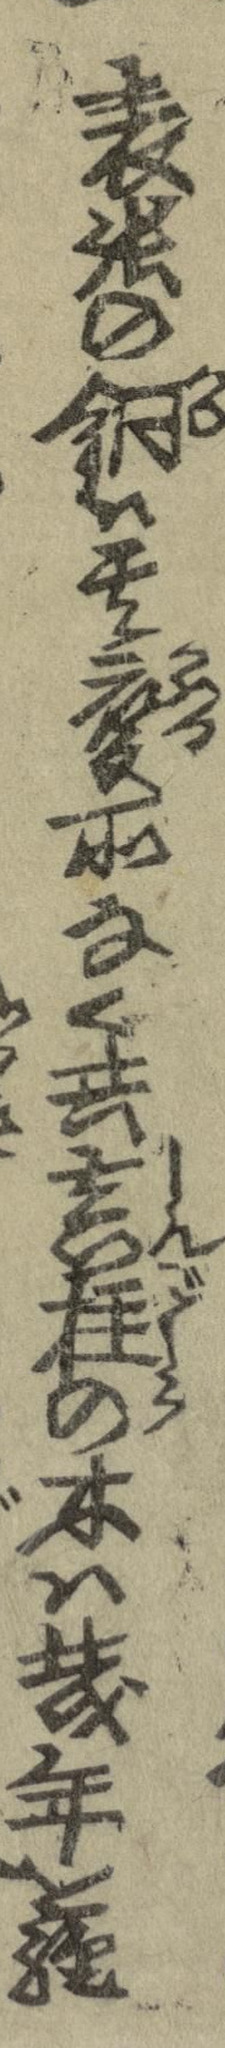表張の銅は其変所なく共真柱の木は幾年を経
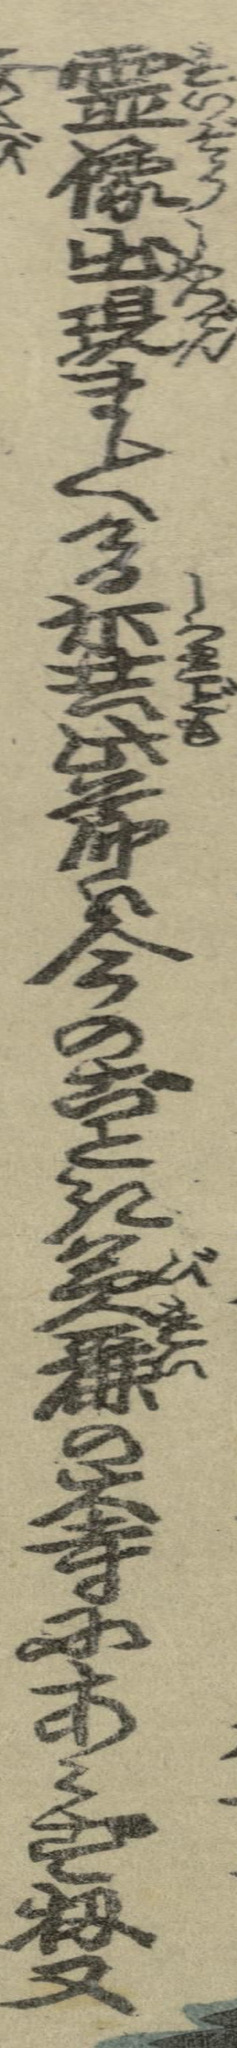霊像出現まし〳〵ける尓共此節は今のことき美麗の大寺にあらす扨又
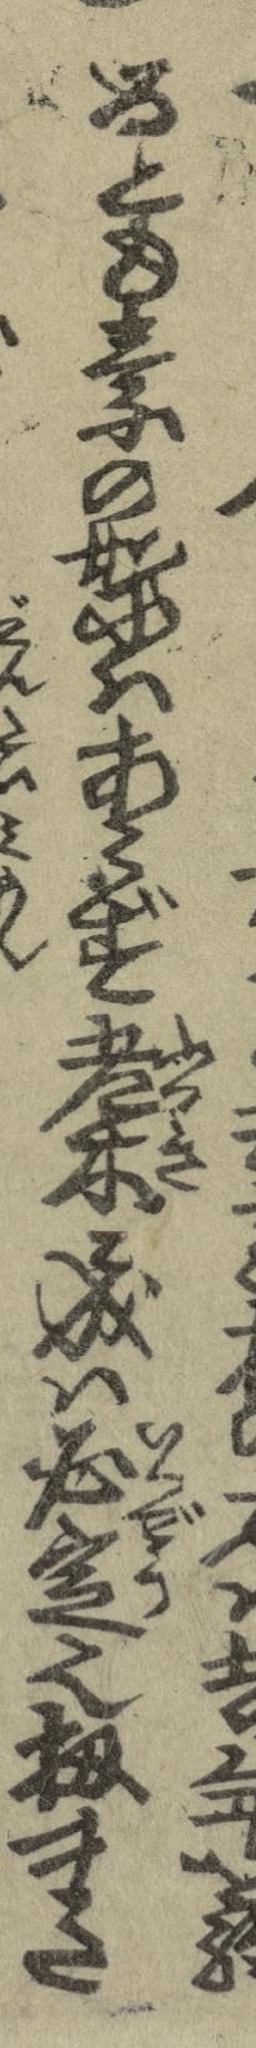るとも素の如にはあらず老木ニ成は必定也扨また
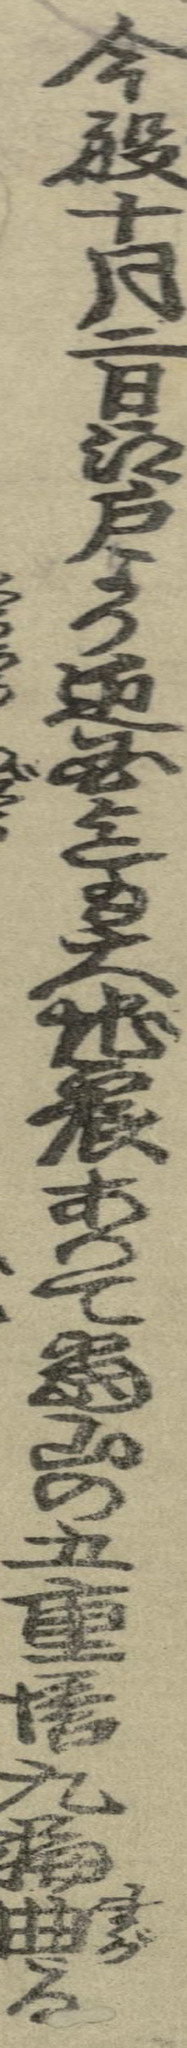今般十月二日江戸より近国迄も大地震ありて当山の五重塔九輪曲る
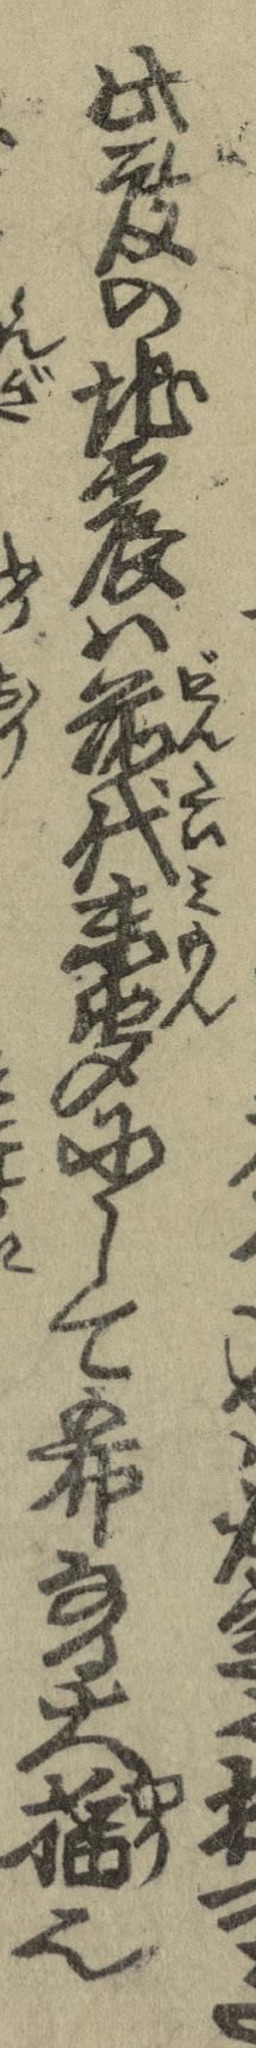此度の地震は前代未聞にして希なる大揺也
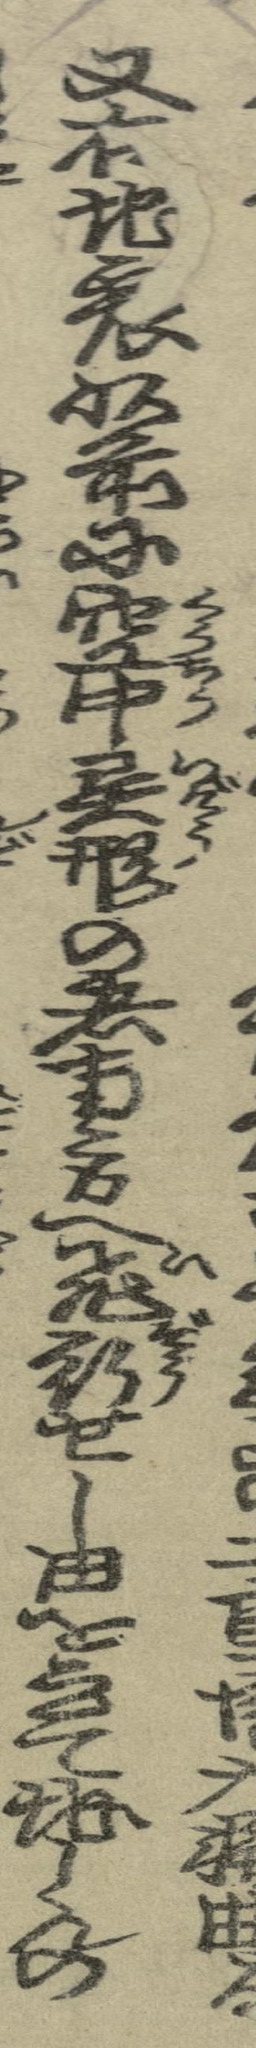又右地震以前に空中異形の者南方へ飛行せし由を云て地しんの
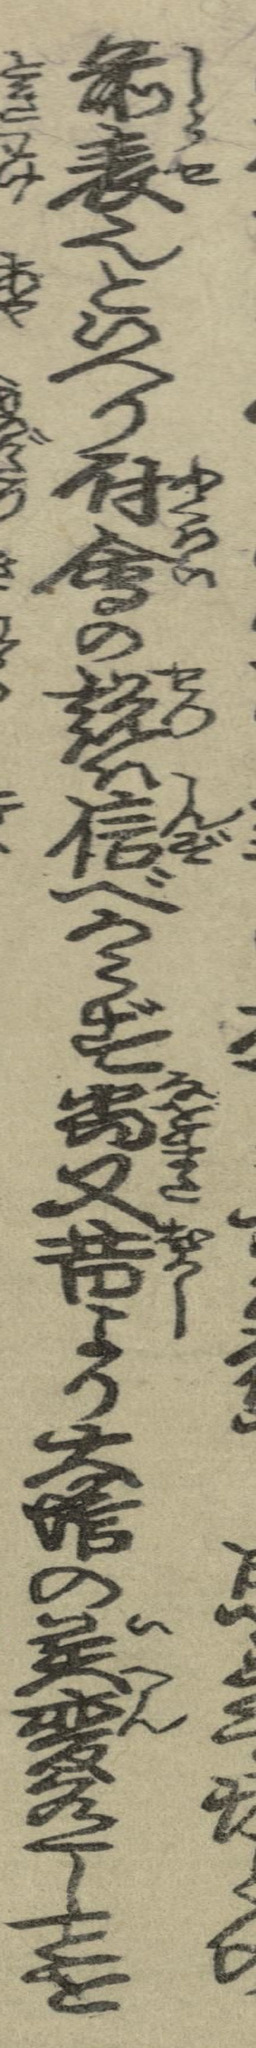前表也といへり付会の説は信べからず尚又昔より大塔の異変有しことを
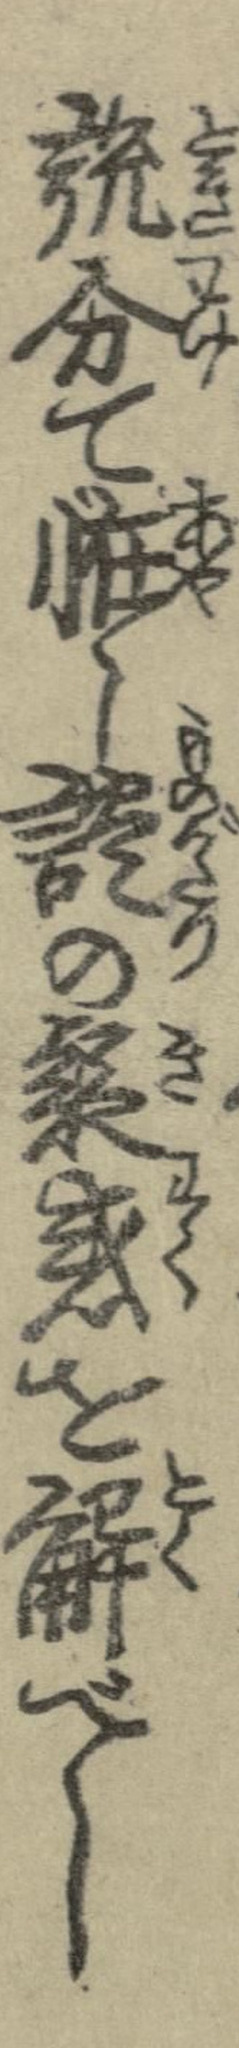説分て怪し談の疑惑を解べし
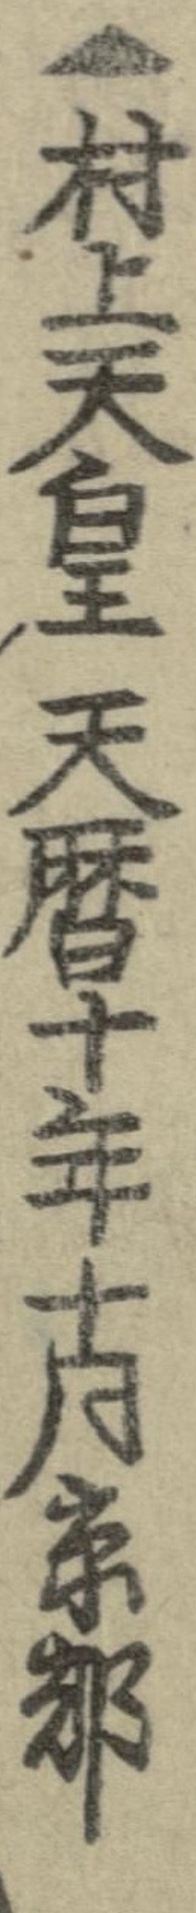▲村上天皇天暦十年十月京都
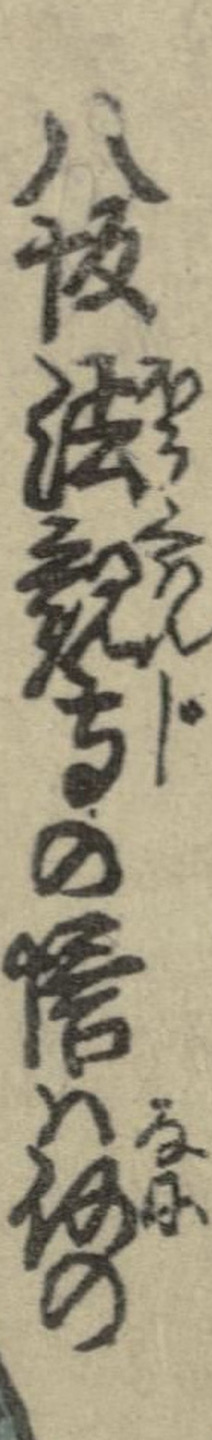八坂法観寺の塔は何の
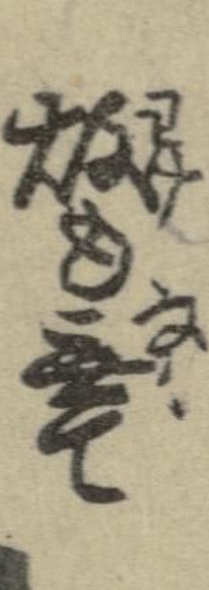故も無て
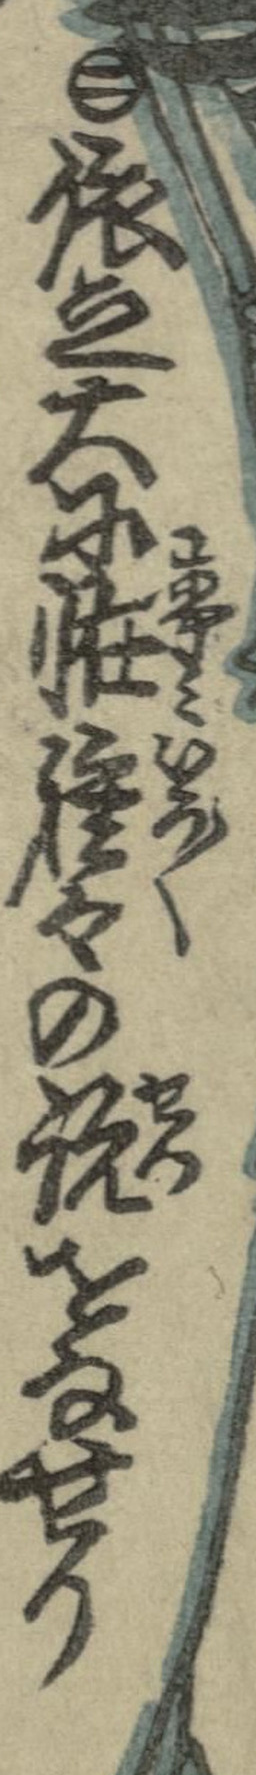㊁依之大に怪種々の説をなせり
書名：浅草寺大塔解譯
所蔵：東京大学地震研究所図書室 Earthquake Research Institute Library, The University of Tokyo, JAPAN
